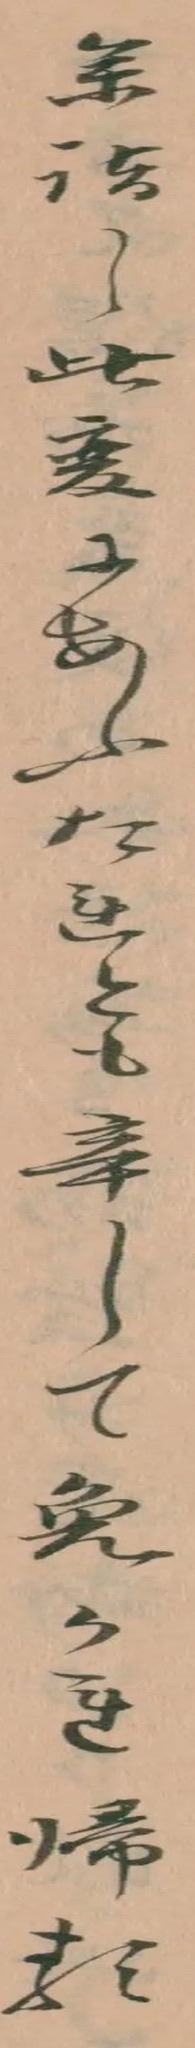参詣し此変にあふたれとも辛して免かれ帰る
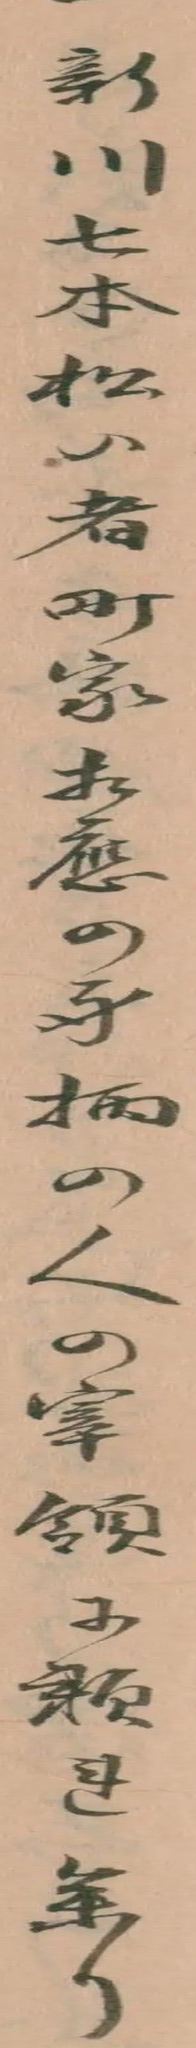一新川七本松の者町家相応身柄の人の宰領に頼まれ参り
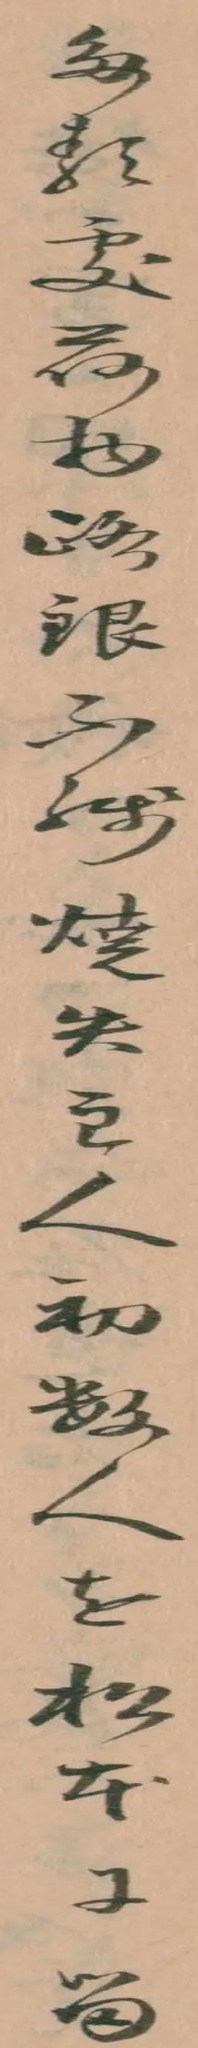たる処荷物路銀不残焼失主人初数人を松本に留
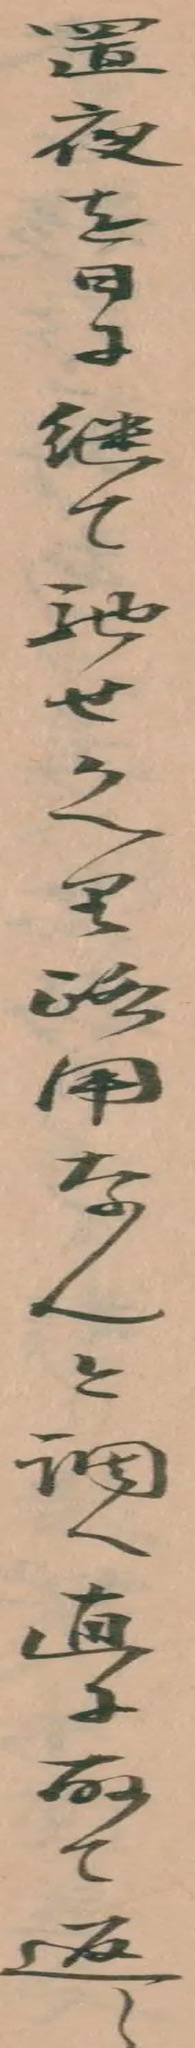置夜を日に継て馳せかへり路用なんと調へ直に取て返し
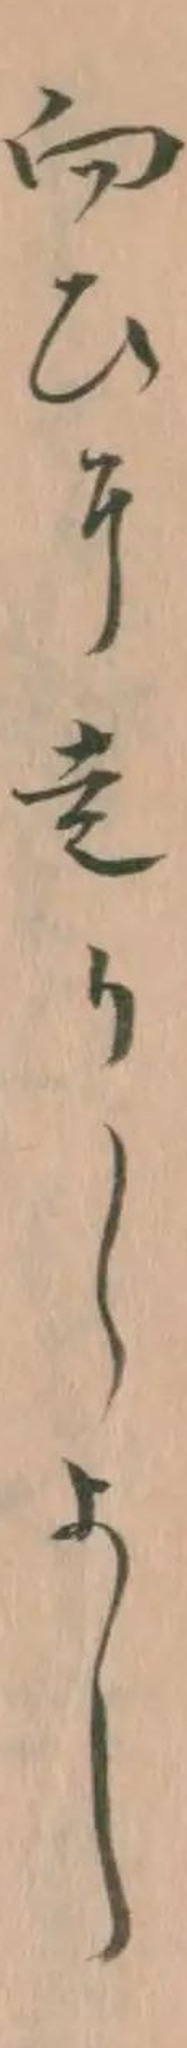向ひに走りよし由
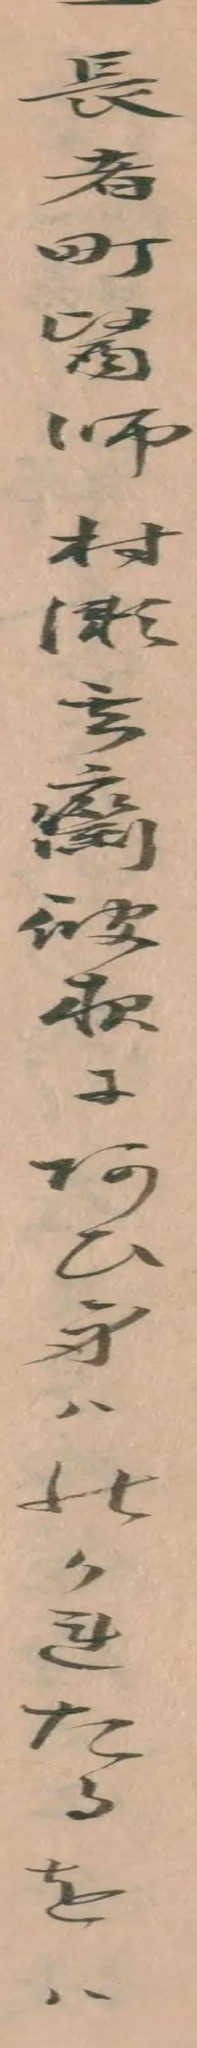一長者町医師村頼立斎彼夜にあひ身ハのかれたるをハ
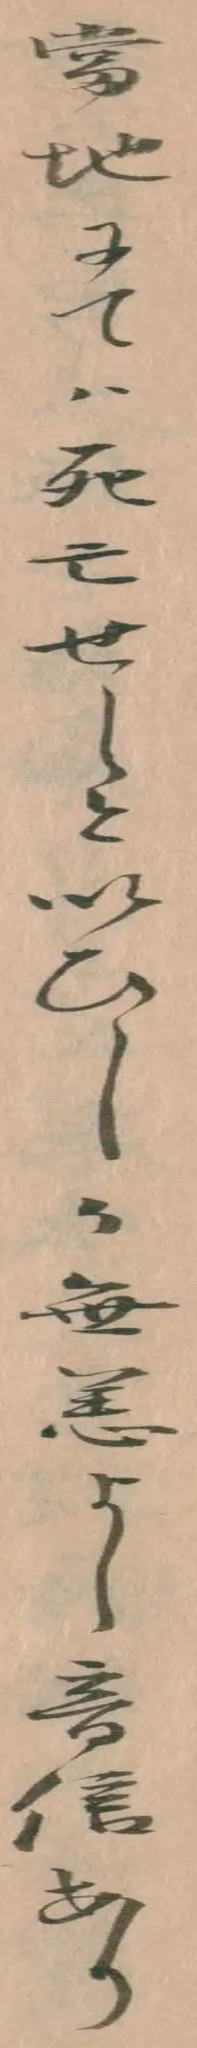当地にてハ死亡せしといひしか無恙よし音信あり
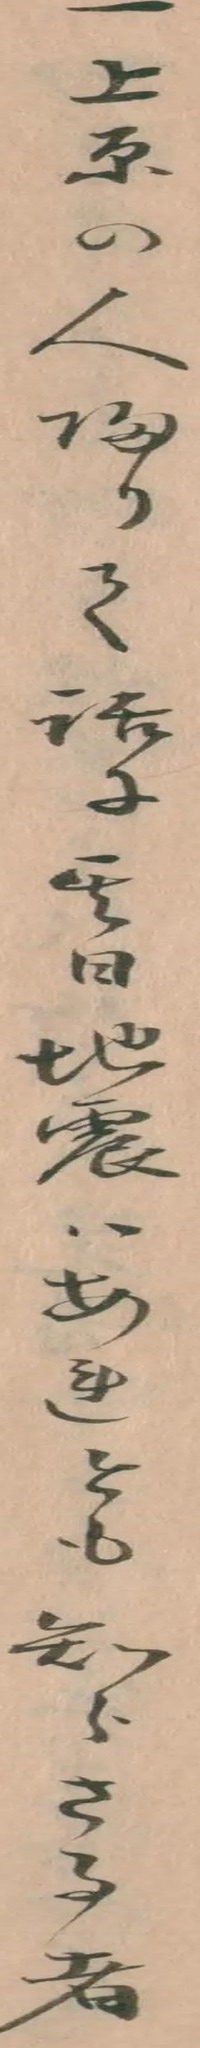一上原の人ありて話に其日地震ハあれとも知らざる者
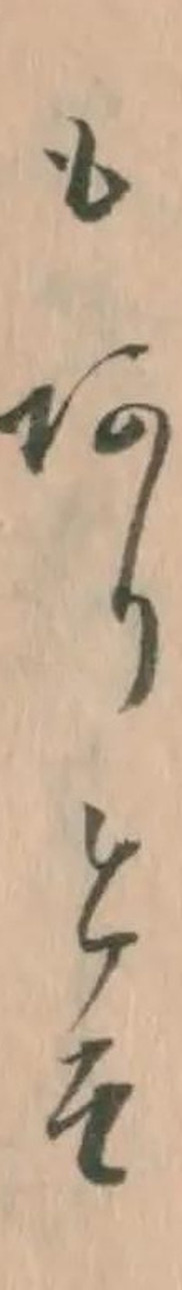も有りとぞ
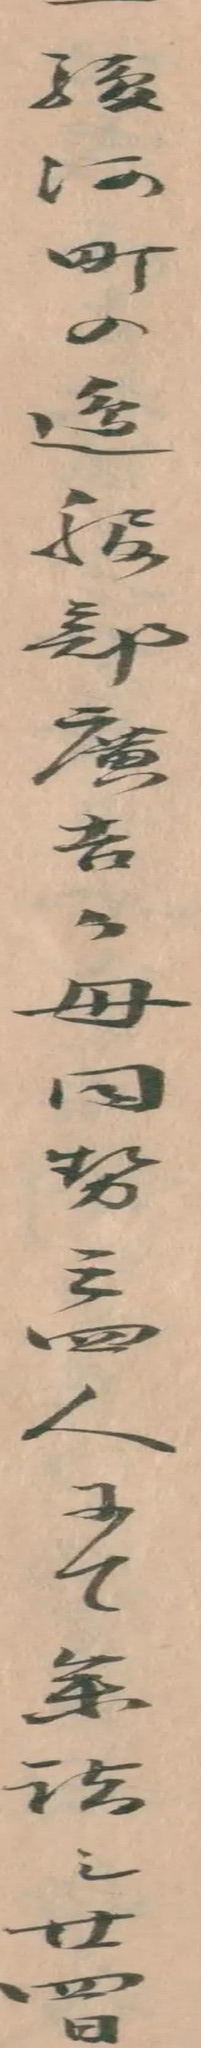一駿河町の辺脇部広吉か母同勢三四人にて参詣し廿四日
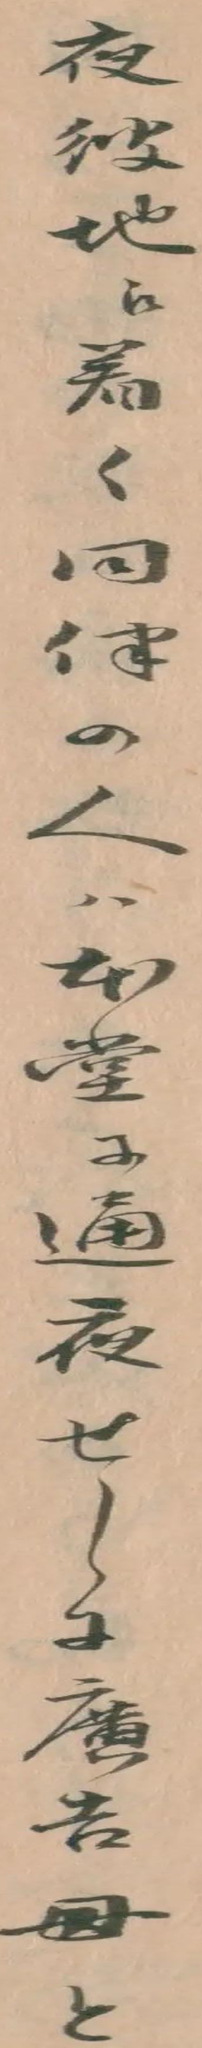夜彼地江着く同伴の人ハ本堂に過夜せしに広吉母と

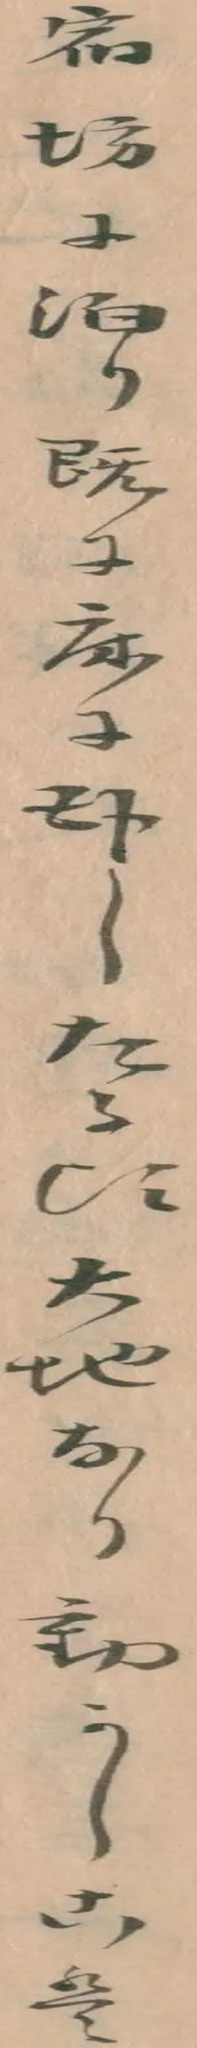宿坊に泊り既に床に臥したる頃大地なり動かしこは
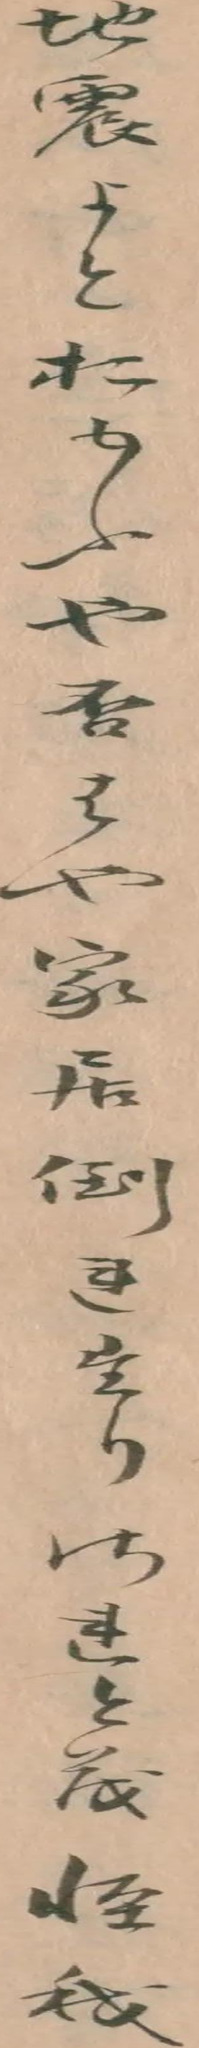地震よとおもふや否はや家居倒れたりつれとも怪我
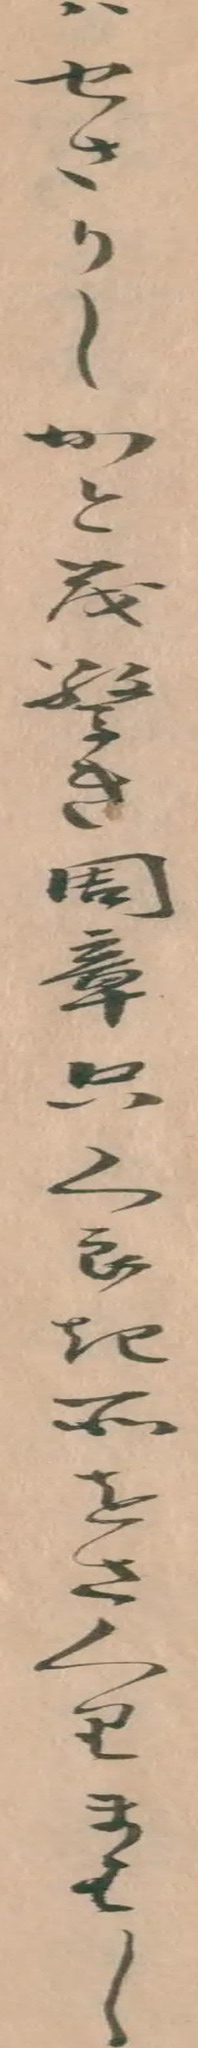ハせさりしかども驚き周章只くらき所をさぐりまはし
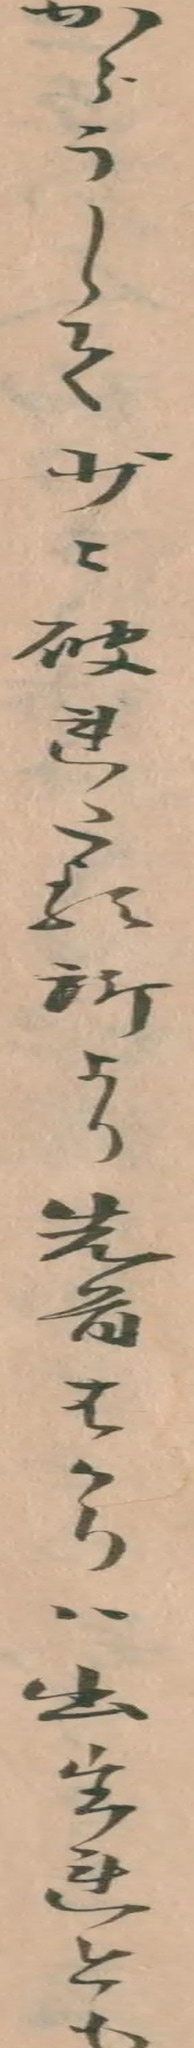からうして少々破れたる所より先首はかりハ出されと
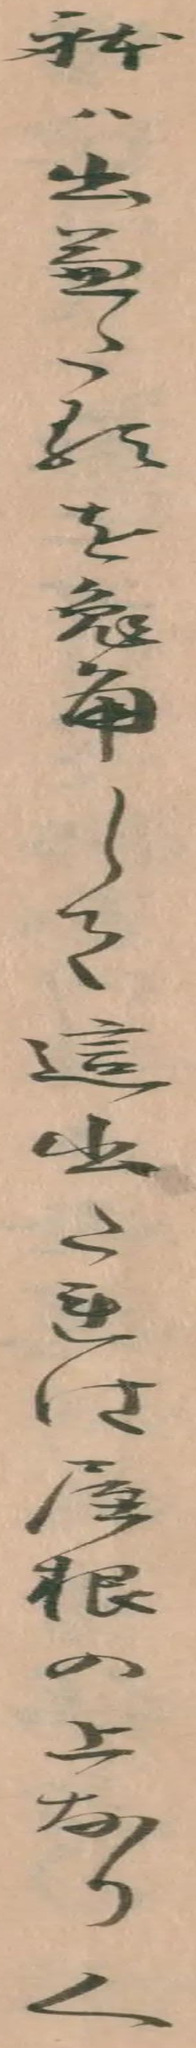も体の出兼たるを兎角して這ひ出たはハ屋根の上なりく
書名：地災撮要. 巻3(地震之部)-巻4(噴火之部)
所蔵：国立国会図書館 National Diet Library, JAPAN
